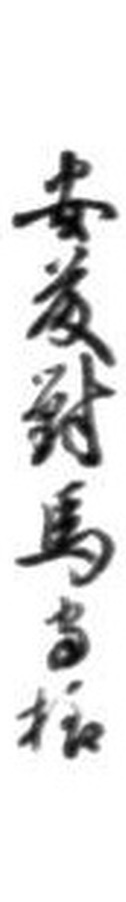安藤対馬守様

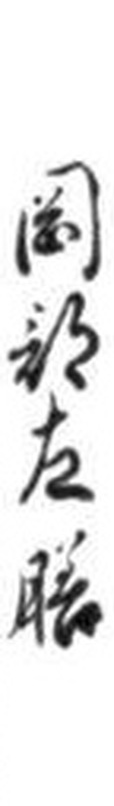岡部左膳
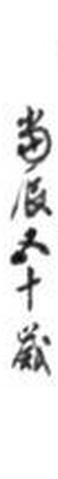当辰五十歳
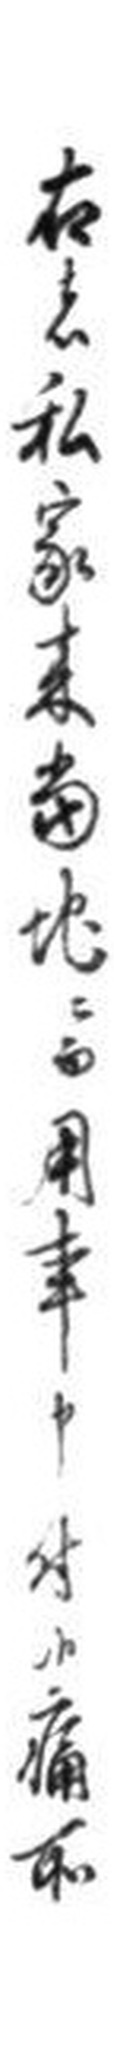右者私家来当地ニ而用事申付候痛所
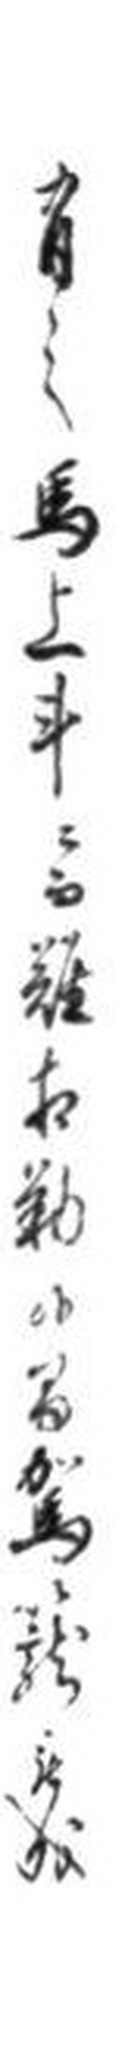有之馬上斗ニ而難相勤候間駕籠被成
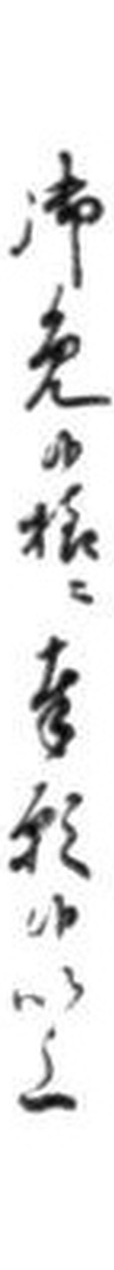御免候様ニ奉願候以上
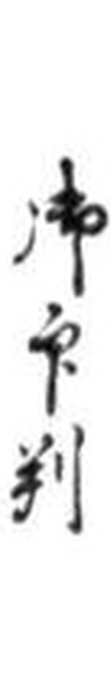御印判
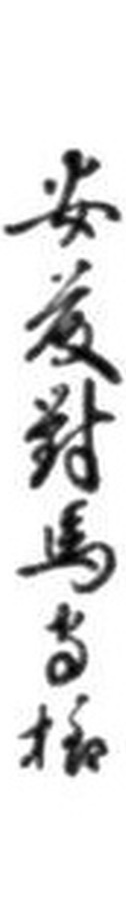安藤対馬守様
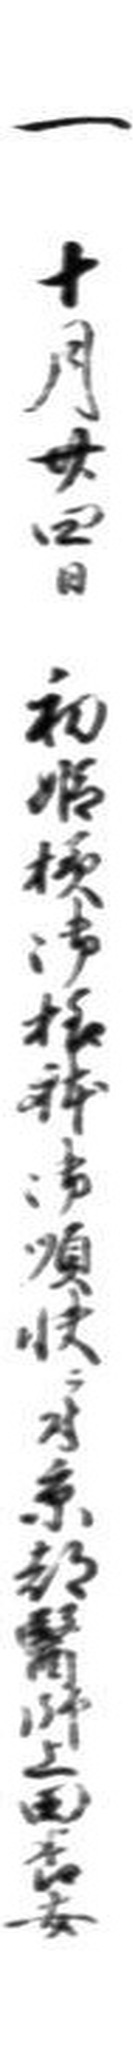一十月廿四日初姫様御様体御順快ニ付京都医師上田養安
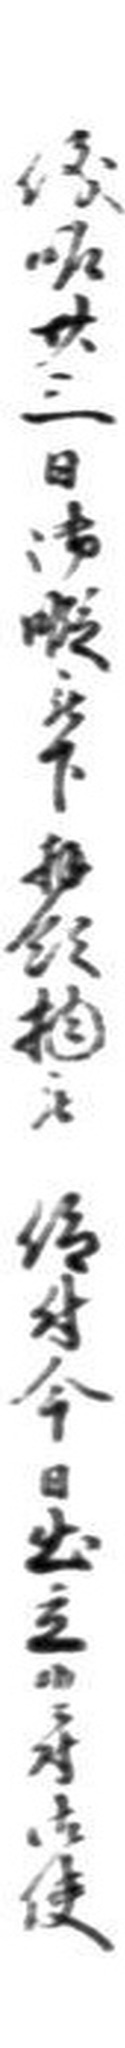儀昨廿三日御暇被下拝領物被仰付今日出立候ニ付御使
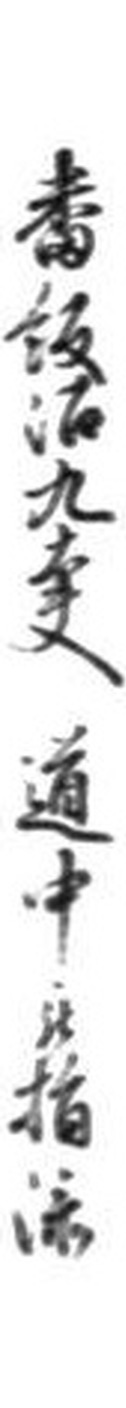番飯沼九太夫道中被指添
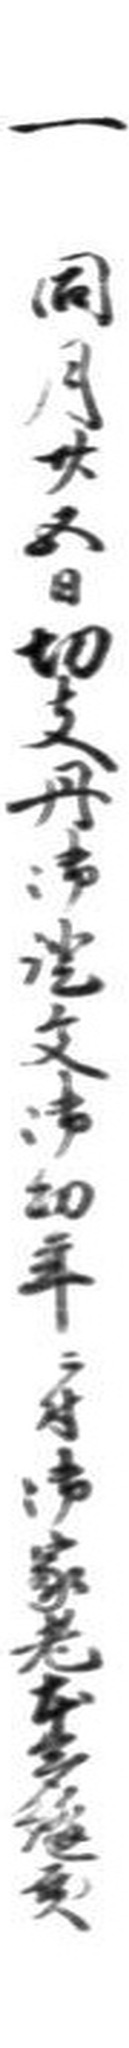一同月廿五日切支丹御証文御幼年ニ付御家老本多縫殿
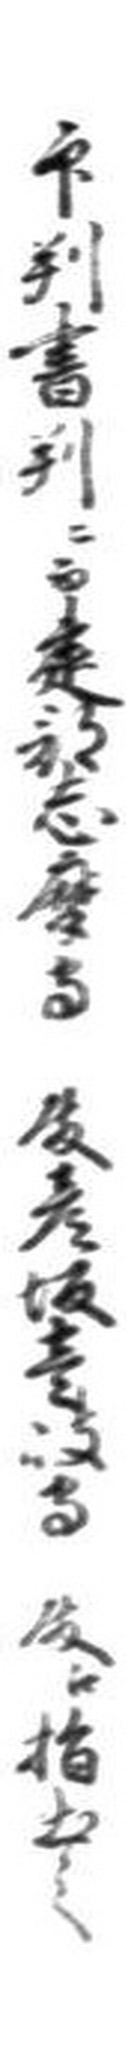印判書判ニ而建部志摩守殿彦坂壱岐守殿江指出之
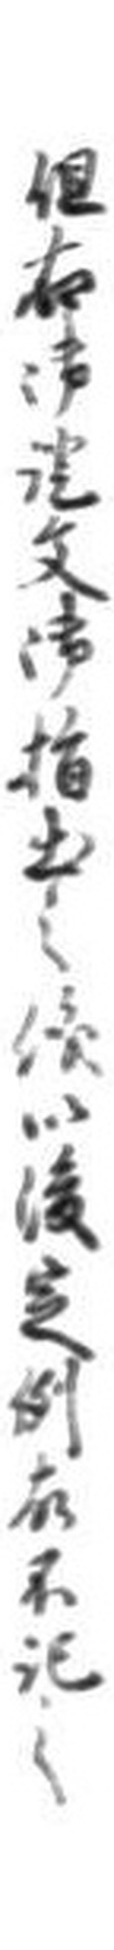但右御証文指出之儀以後定例故不記之
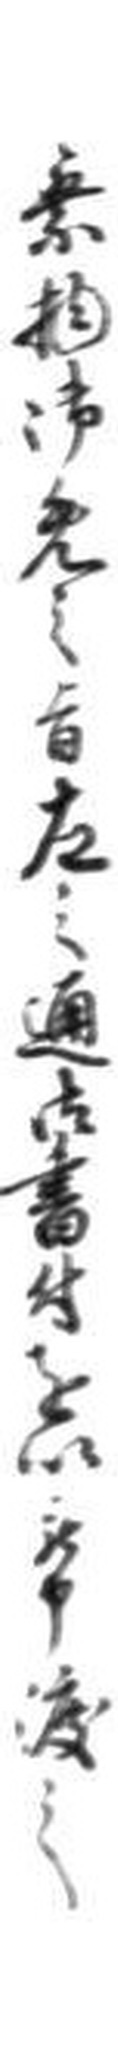乗物御免之旨左之通御書付を以被申渡之

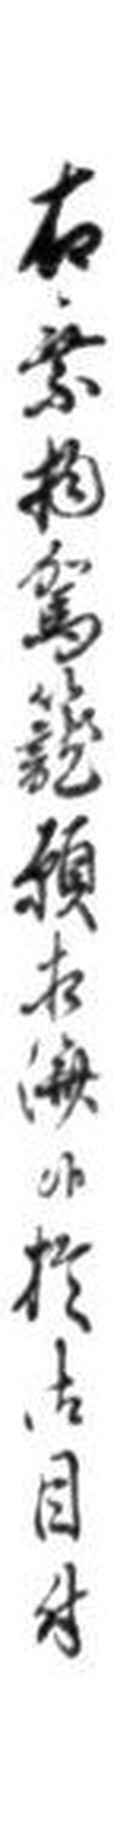右乗物駕籠願相済候於御目付
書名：家譜 三十八 宗矩公 従享保九年五月到享保九年十二月
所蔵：福井県文書館 Fukui Prefectural Archives
